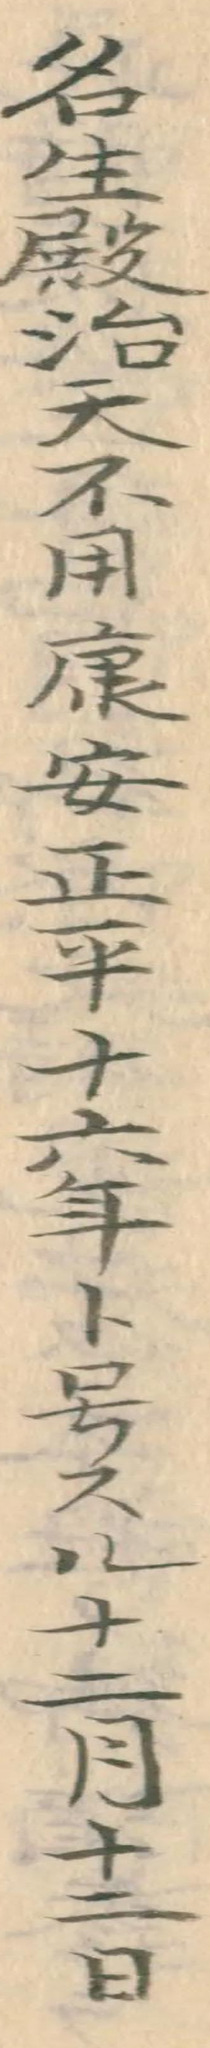名生殿治天不用康安正平十六年ト号スル十二月十二日
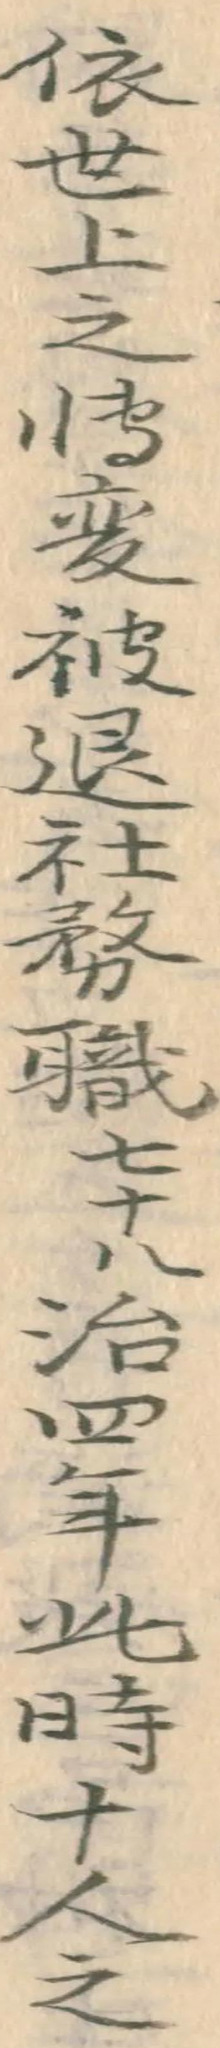依世上之転変被退社務職七十八治四年此時十人之
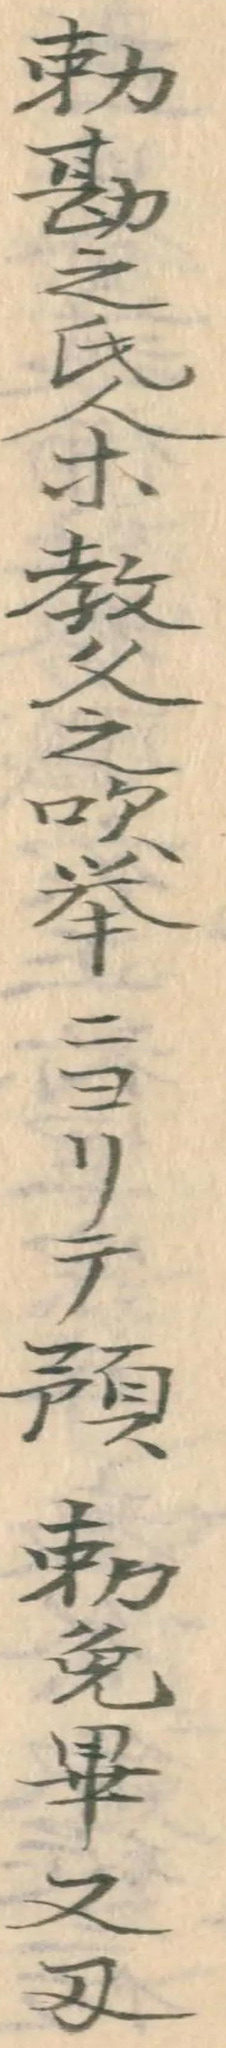勅勘之氏人等教久之吹挙ニヨリテ預勅免畢又刃
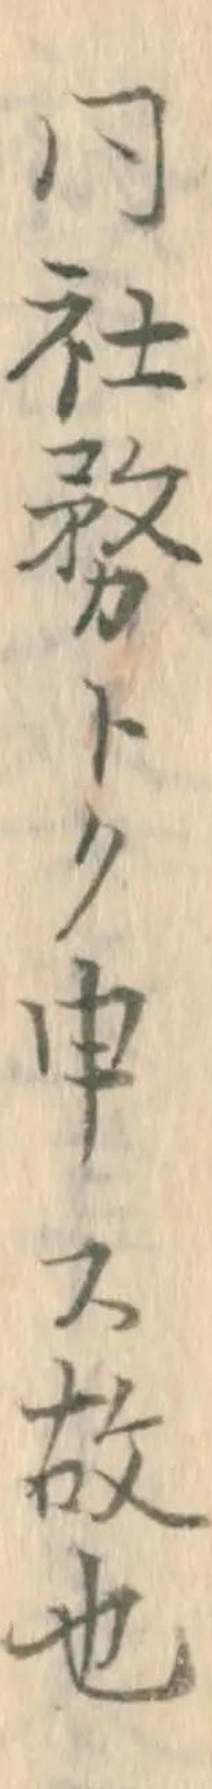同社務トク申ス故也
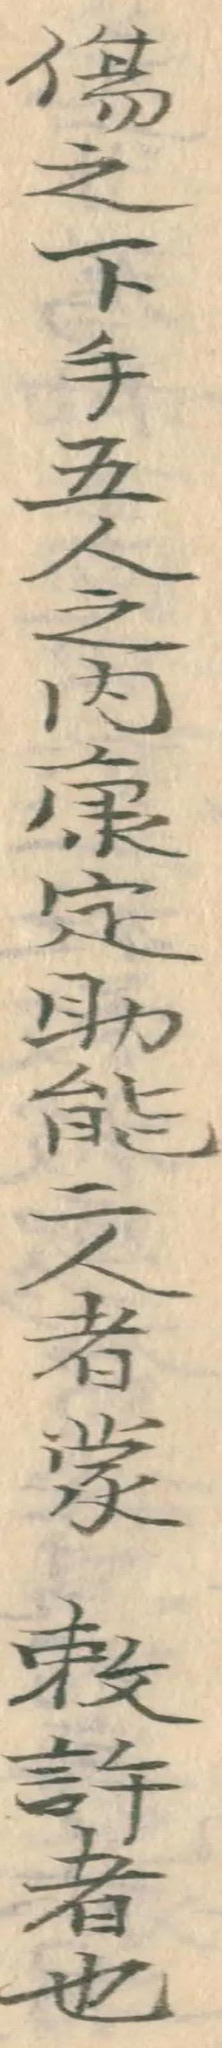傷之下手五人之内康定助能二人者蒙勅許者也
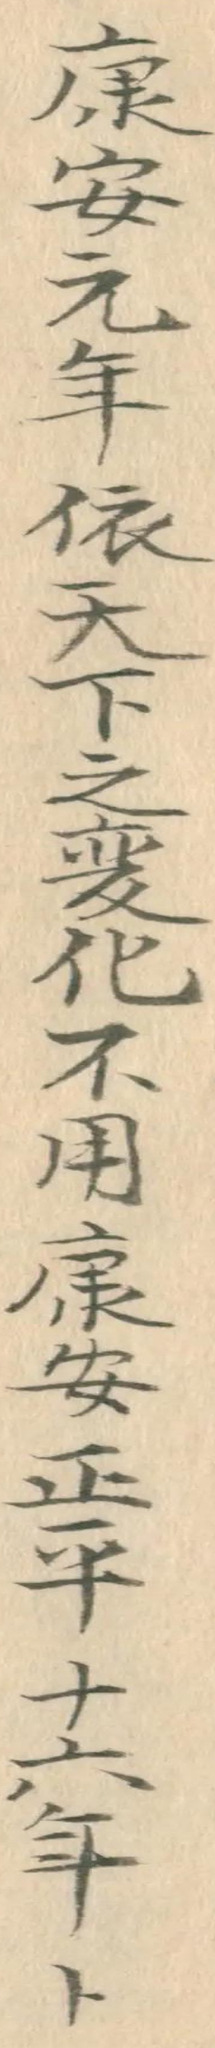康安元年依天下之変化不用康安正平十六年ト
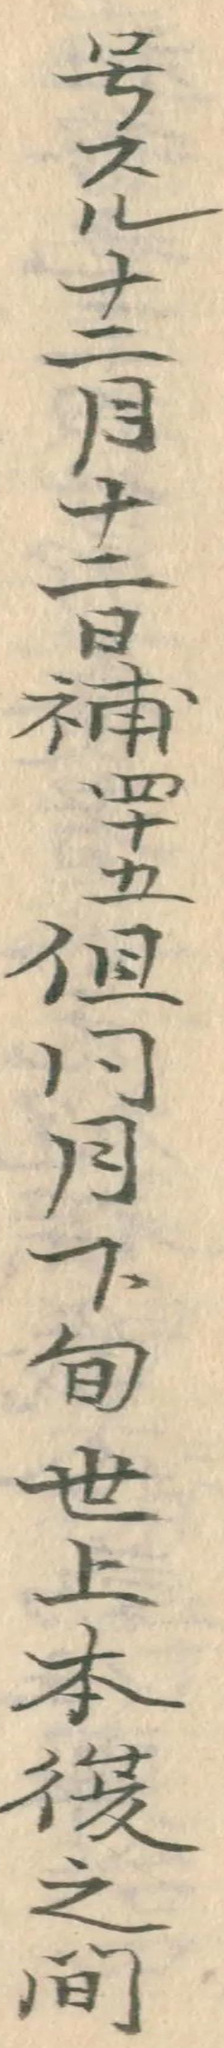号スル十二月十二日補四十五但同月下旬世上本復之間
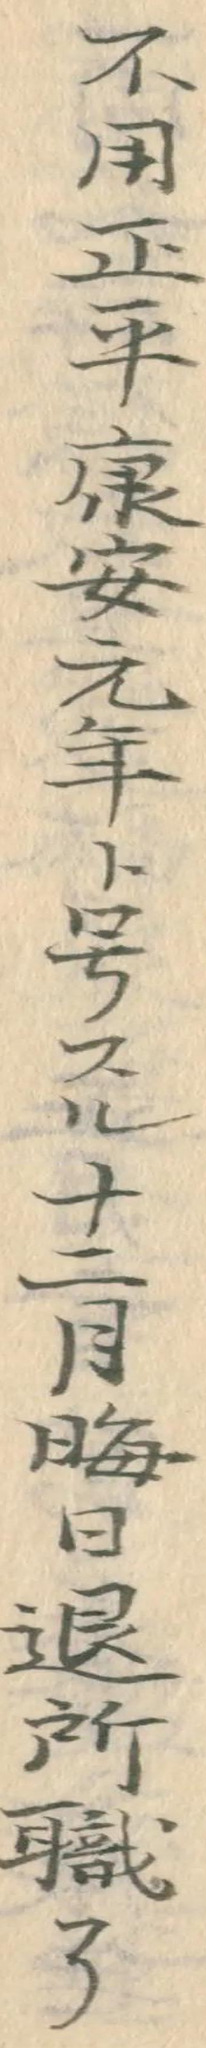不用正平康安元年ト号スル十二月晦日退所職了
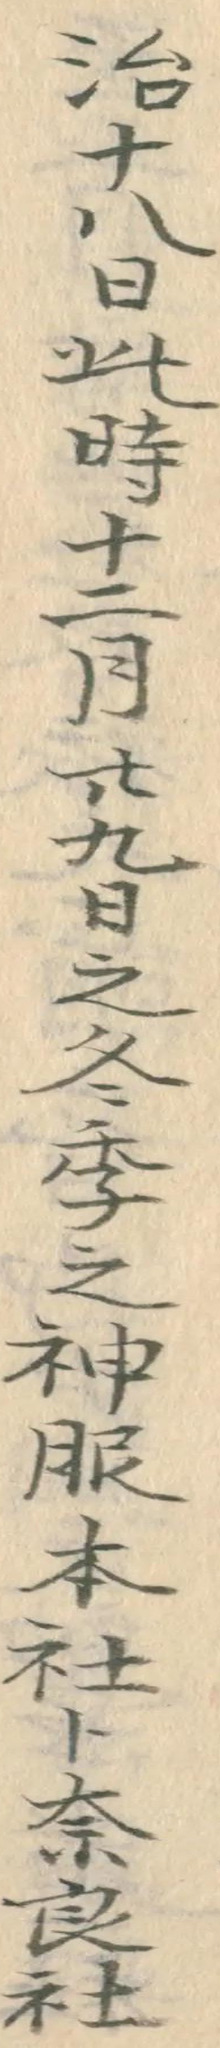治十八日此時十二月廿九日之冬季之神服本社ト奈良社
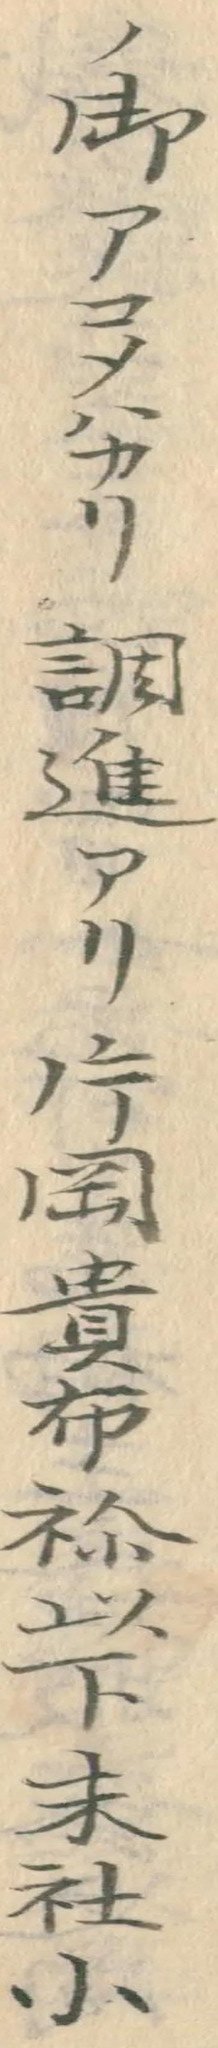ノ御アコメハカリ調進アリ片岡貴布祢以下末社小
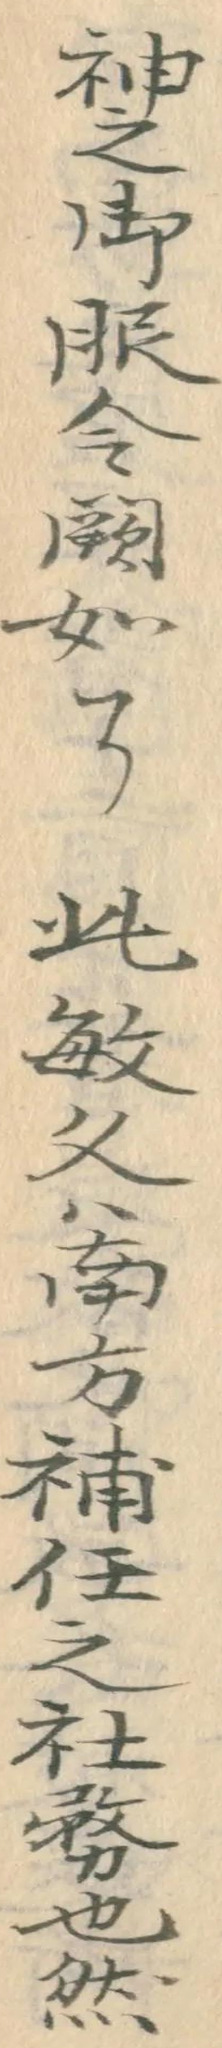神之御服令闕如了此敏久ハ南方補任之社務也然

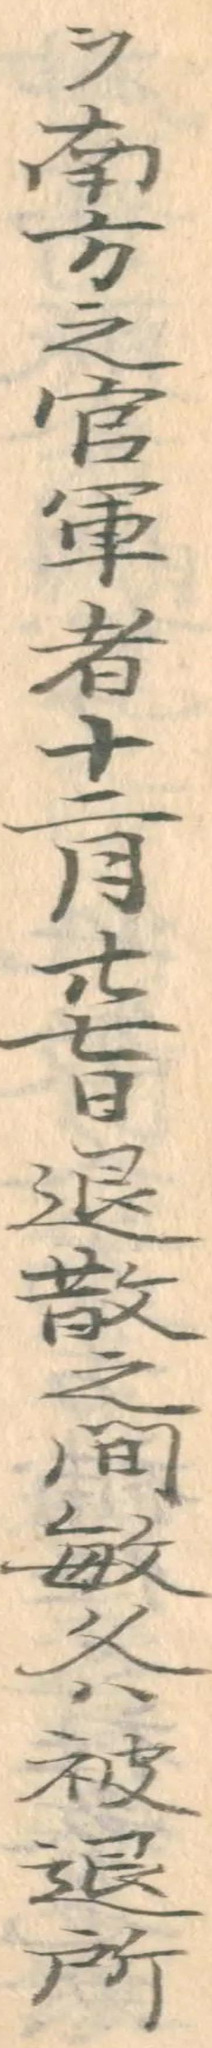ヲ南方之官軍者十二月廿七日退散之間敏久ハ被退所
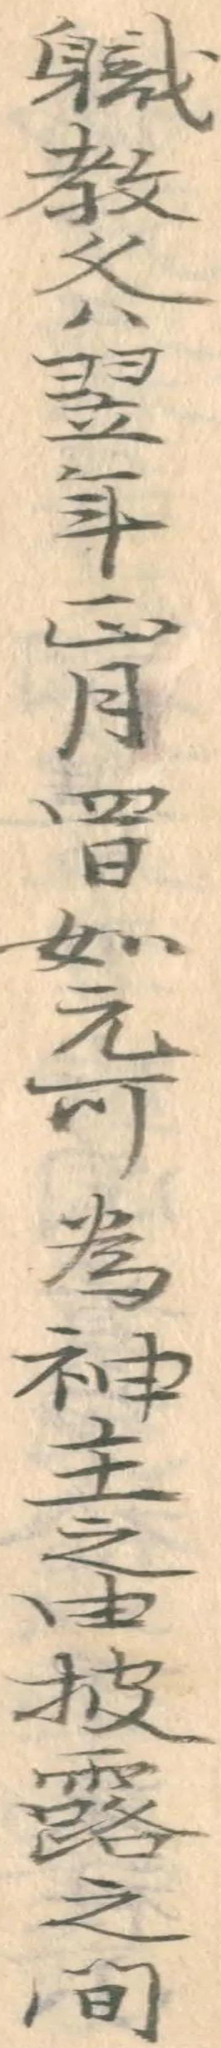職教久ハ翌年正月四日如元可為神主之由披露之間
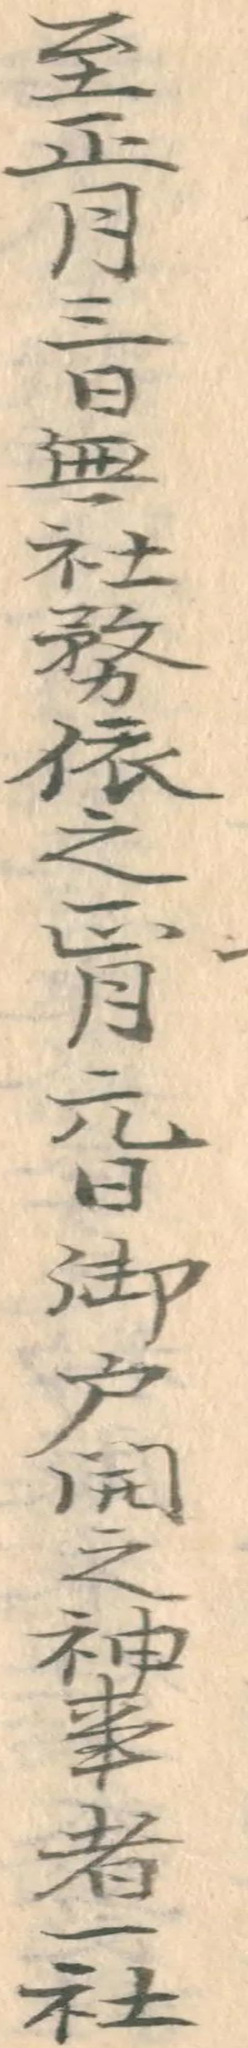至正月三日無社務依之正月元日御戸開之神事者一社
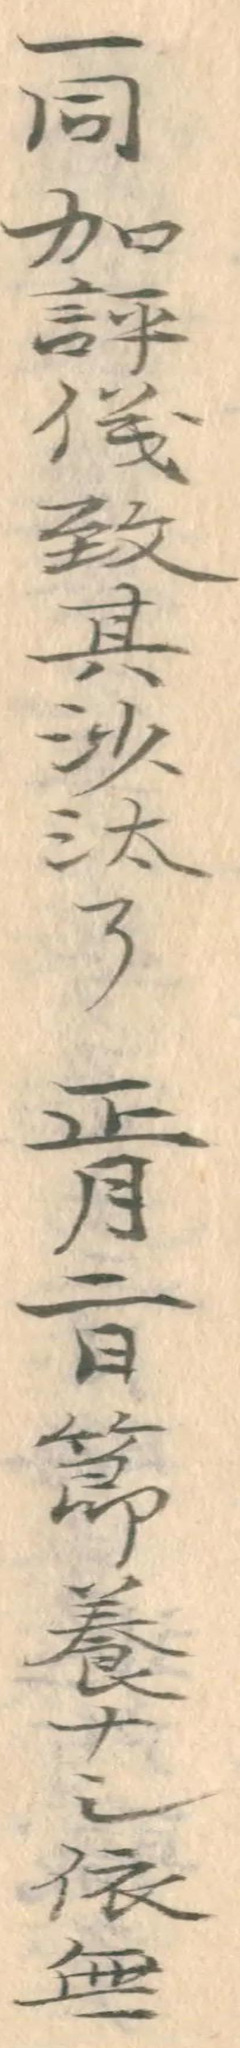一同加評儀致其沙汰了正月二日節養ナシ依無
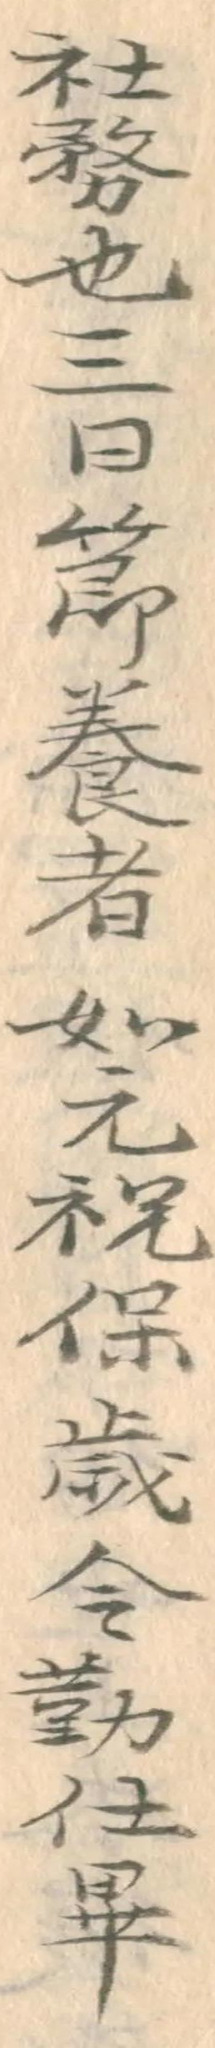社務也三日節養者如元祝保歳令勤仕畢
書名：賀茂社記録. 第24冊
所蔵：国立国会図書館 National Diet Library, JAPAN
